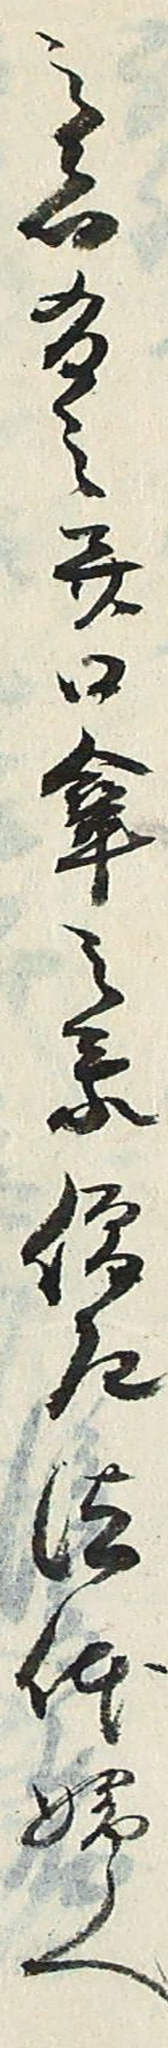之者有之幷日傘之義僧尼法体婦人
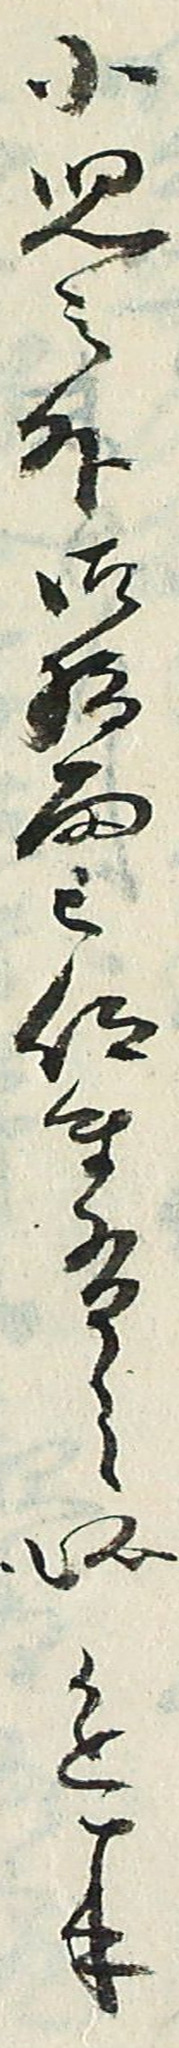小児之外御指留被仰付有之候所近来
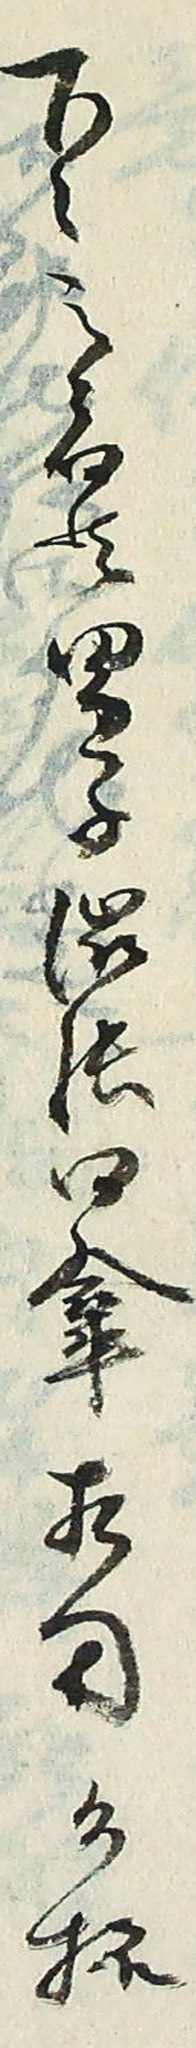下々之者共男子渋張日傘相用候様
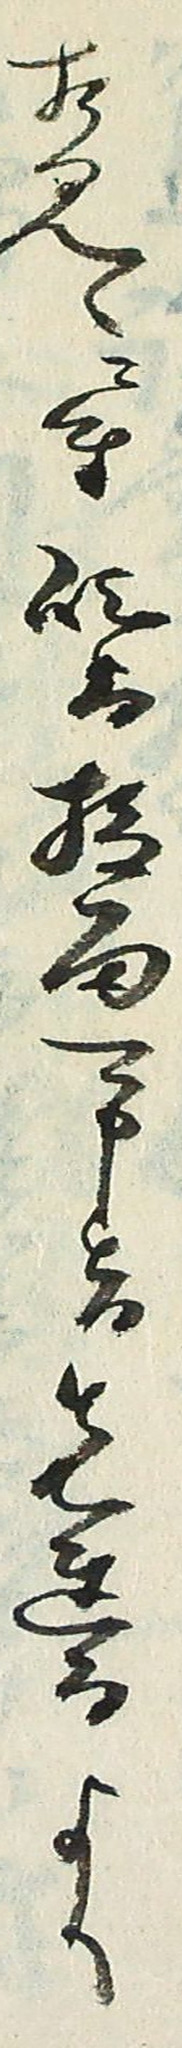相見候に付屹と指留可申旨先達而より
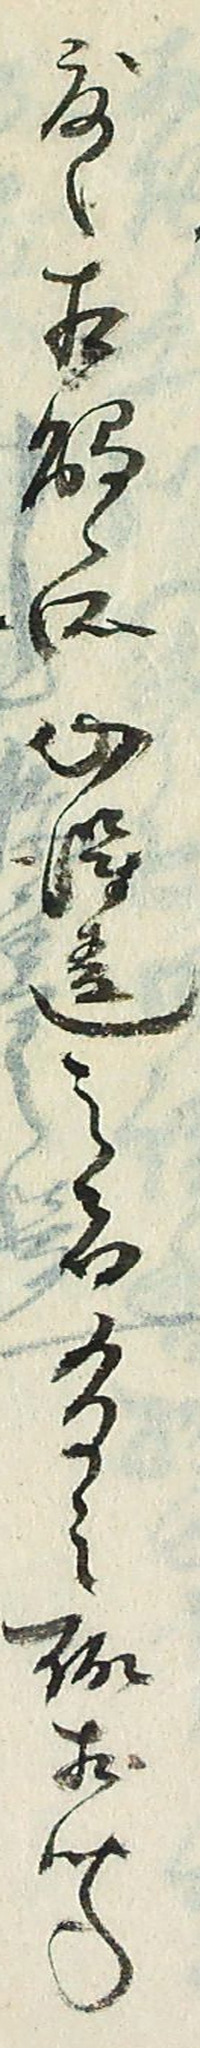度々相触候所心得違之者有之趣相聞
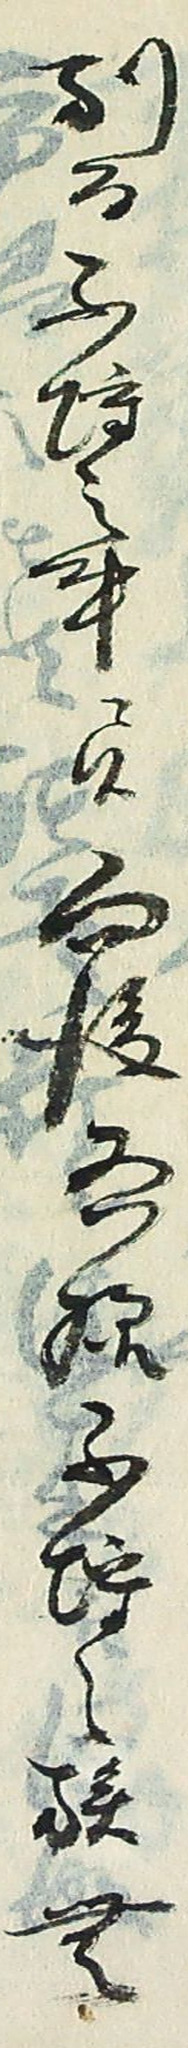別而不埒之事に候向後右様不埒之族無
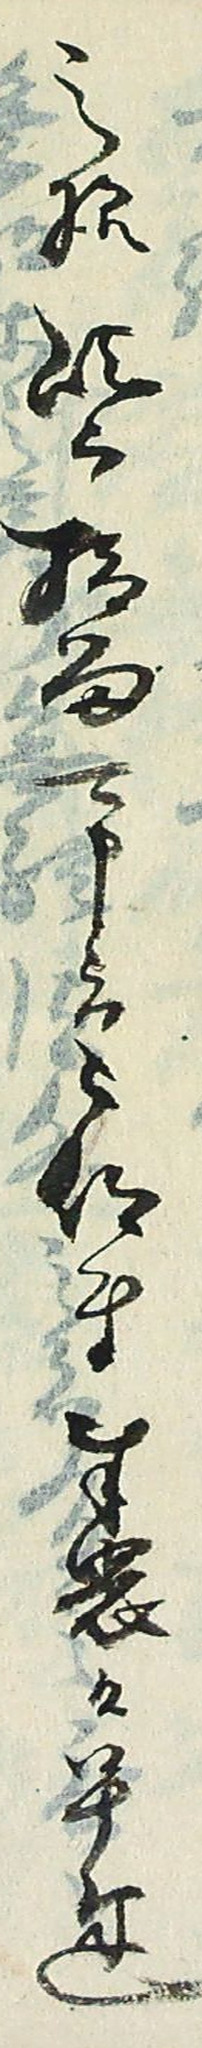之様屹と指留可申旨被仰付奉畏候早速
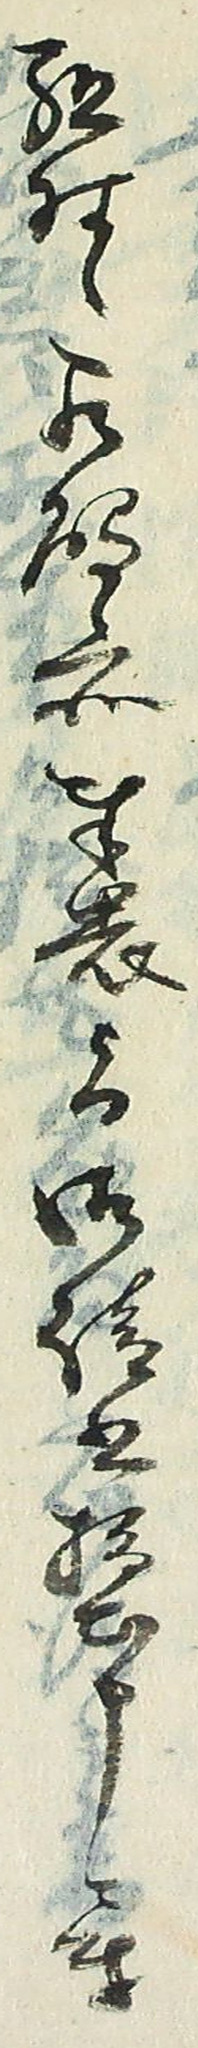組村へ相触候所奉畏旨御請書指出申に付
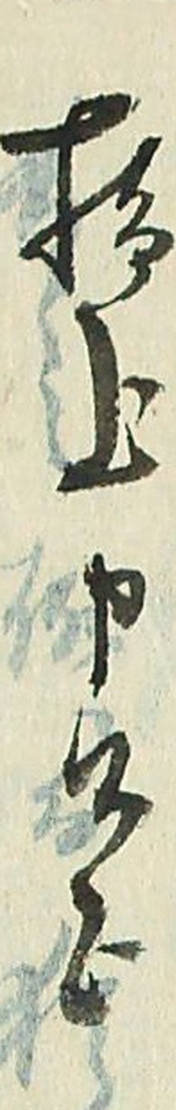指上申候以上
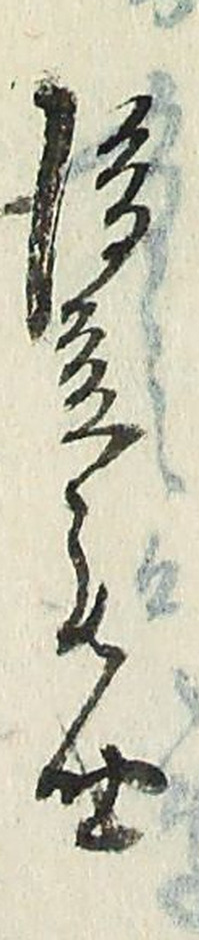後藤庄助
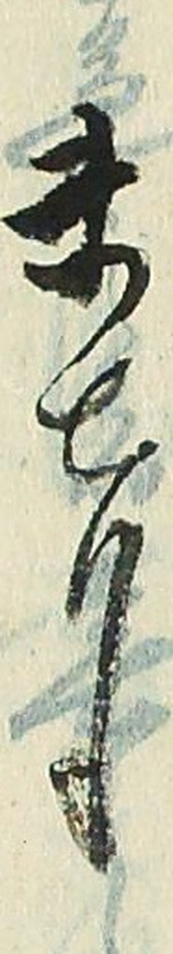未七月
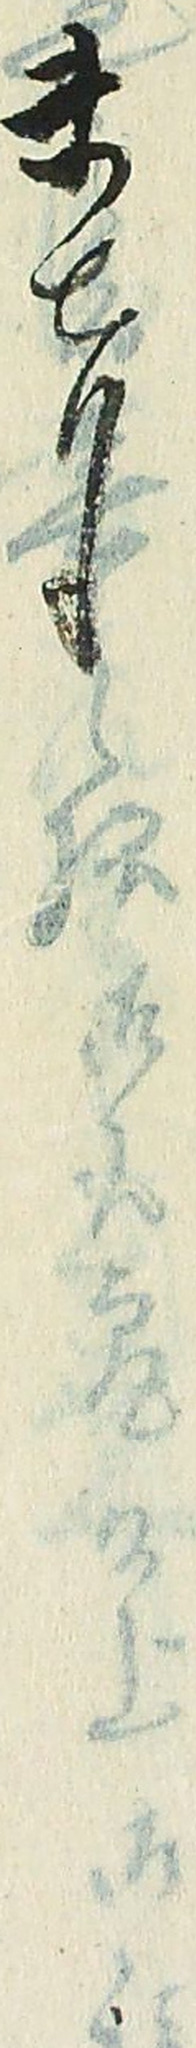未七月
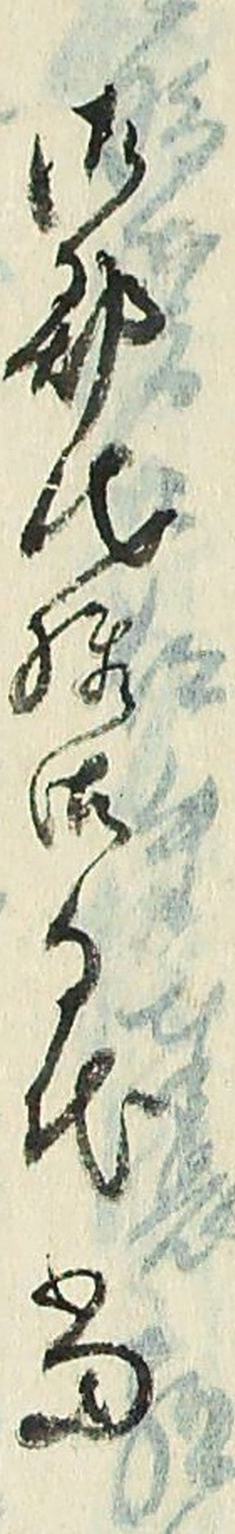御郡代様御手代当
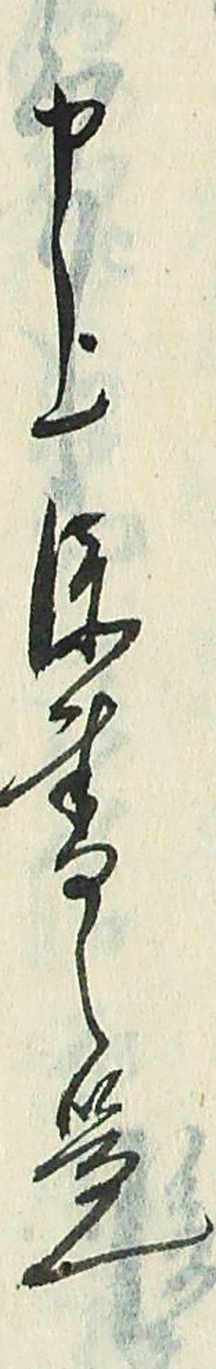申上添書之覚
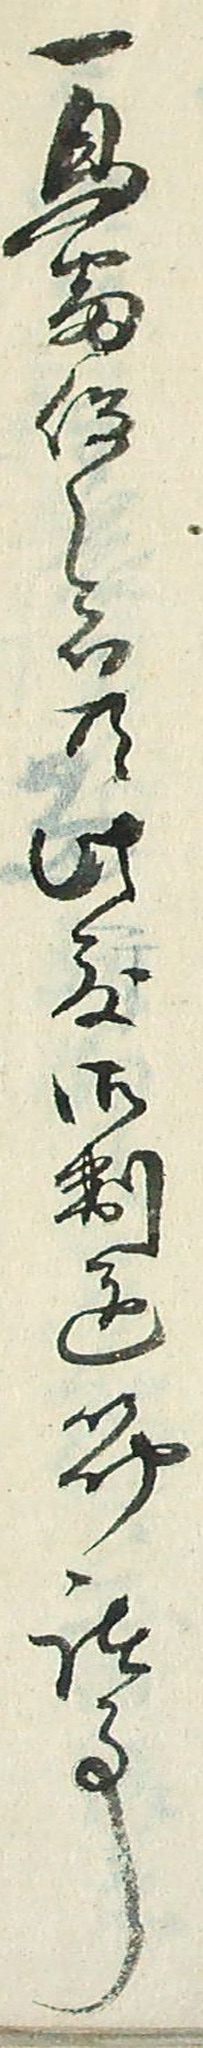一鳥番役之者共此度御制道筋諸事

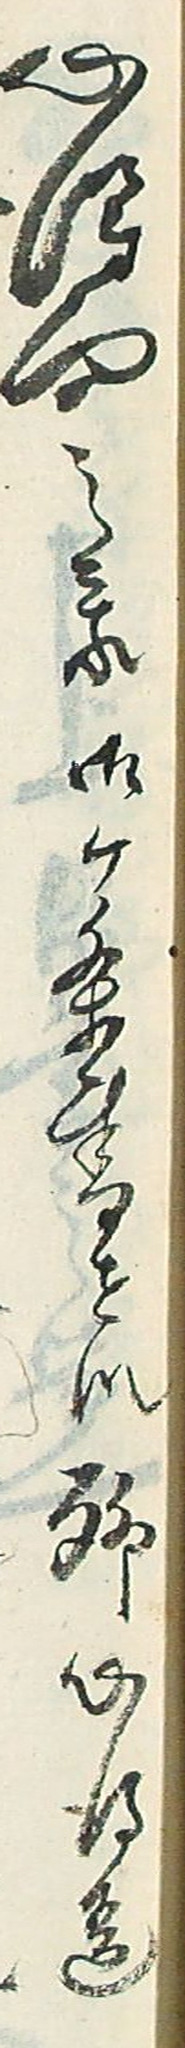心得向之義御ケ条奉るを以聊心得違
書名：諸御用御□受書控
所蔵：鳴門教育大学 Naruto University of Education
